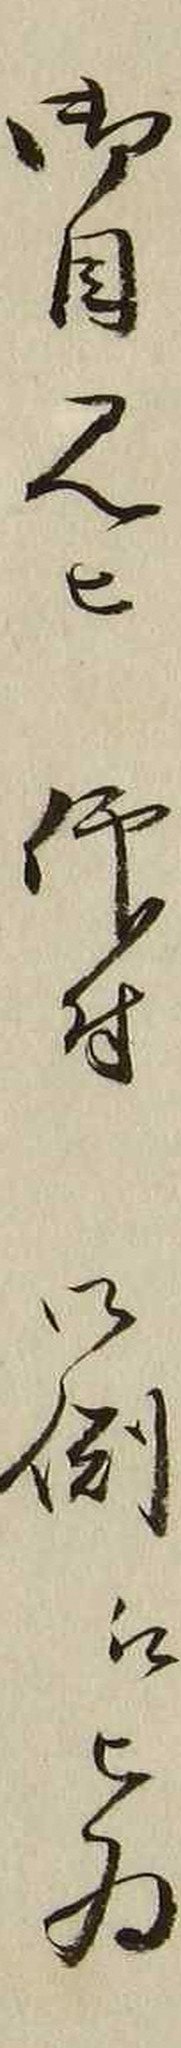御目見被仰付御側江被為
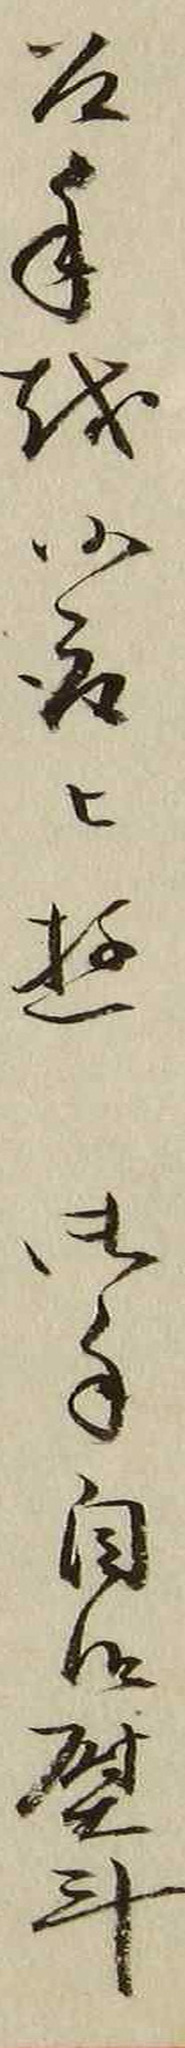召手を御取被遊御手自御熨斗
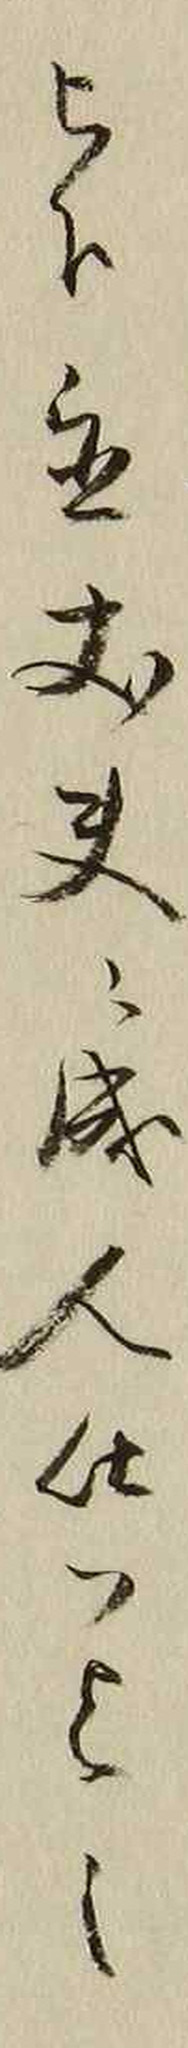被下置丈夫ニ成人仕候与之
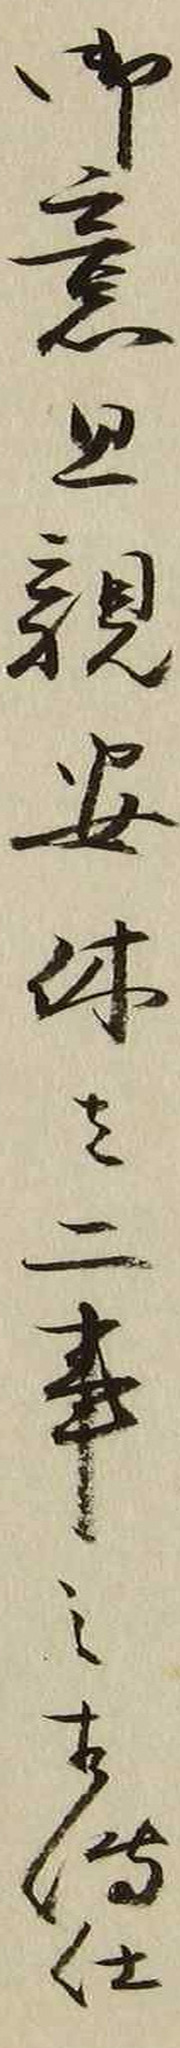御意且親安休は二事之相伝仕
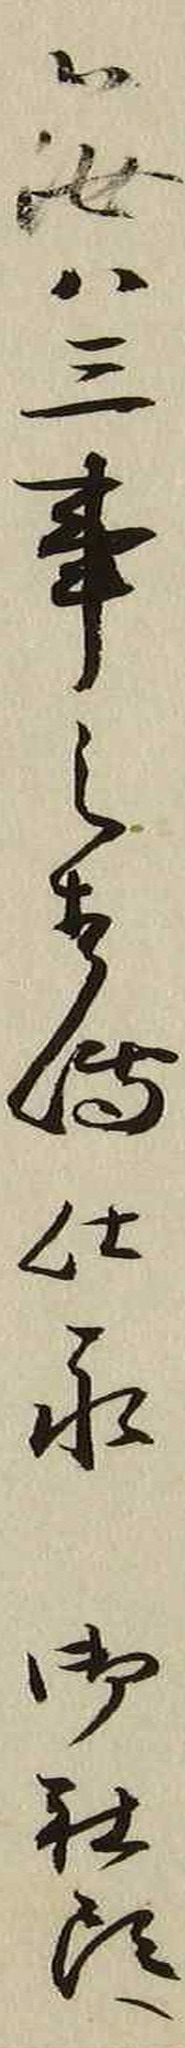候汝ハ三事之相伝仕承御社頭へ
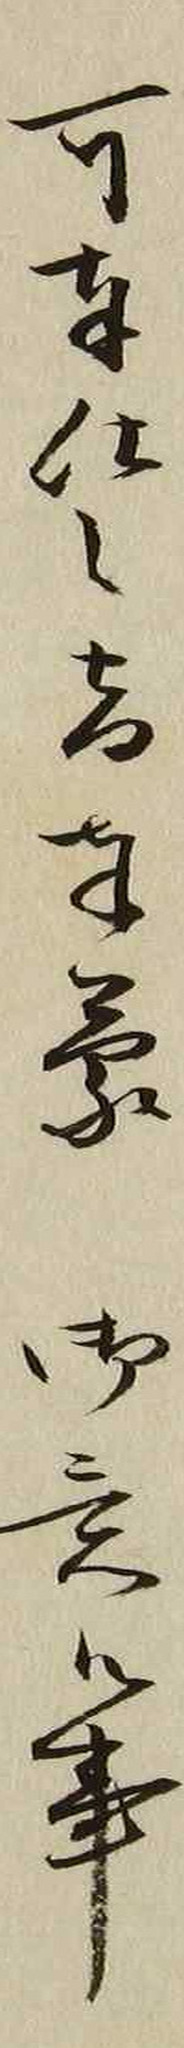可奉仕之旨奉蒙御意候事
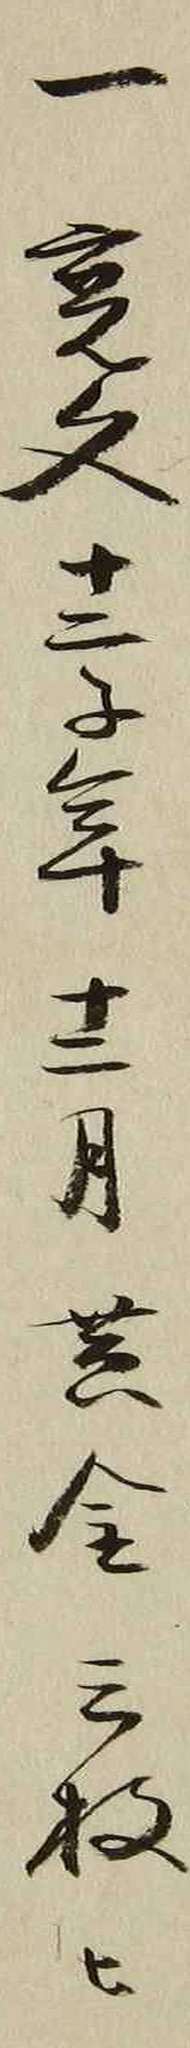一寛文十二子年十二月黄金三枚被
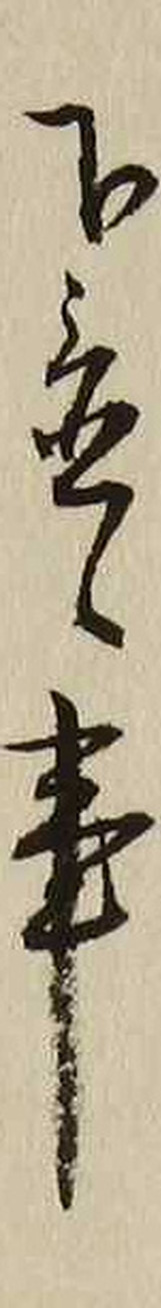下置候事
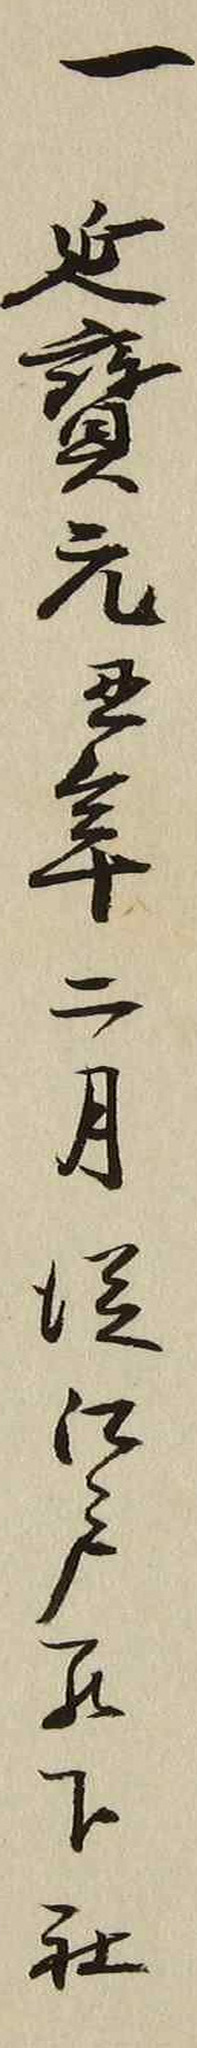一延宝元丑年二月従江戸罷下社
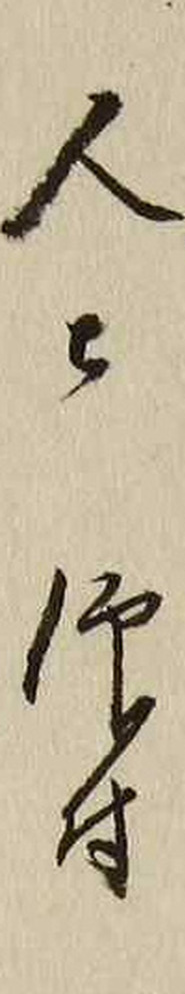人被仰付
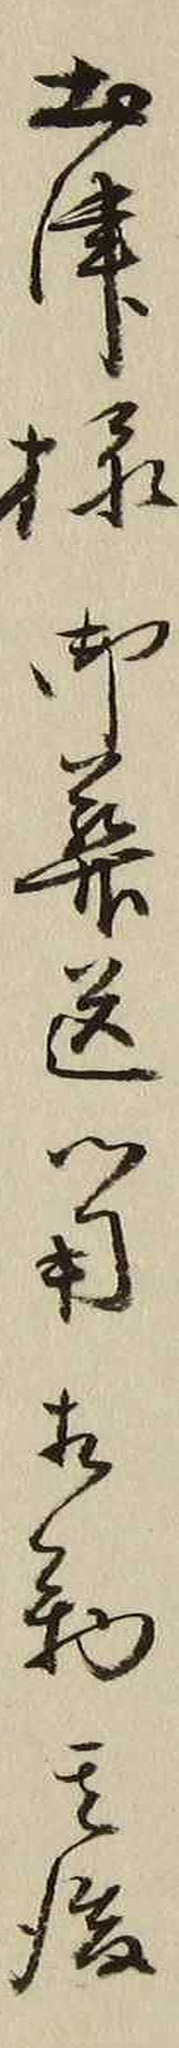土津様御葬送御用相勤其後
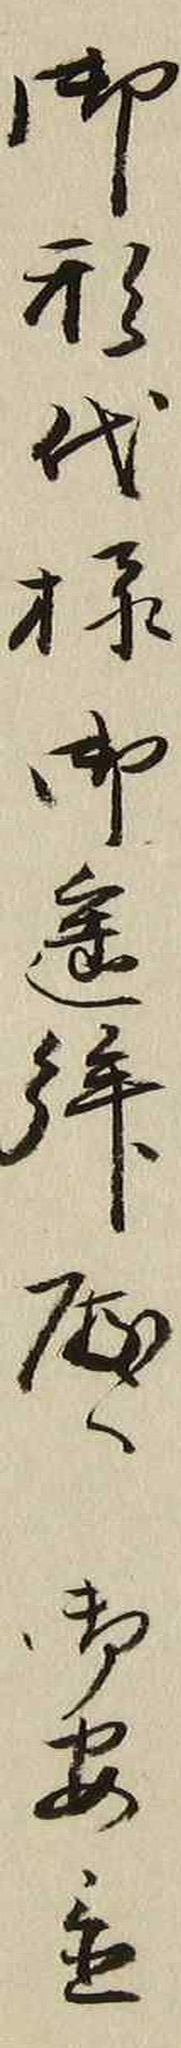御形代様御遥拝殿へ御安置
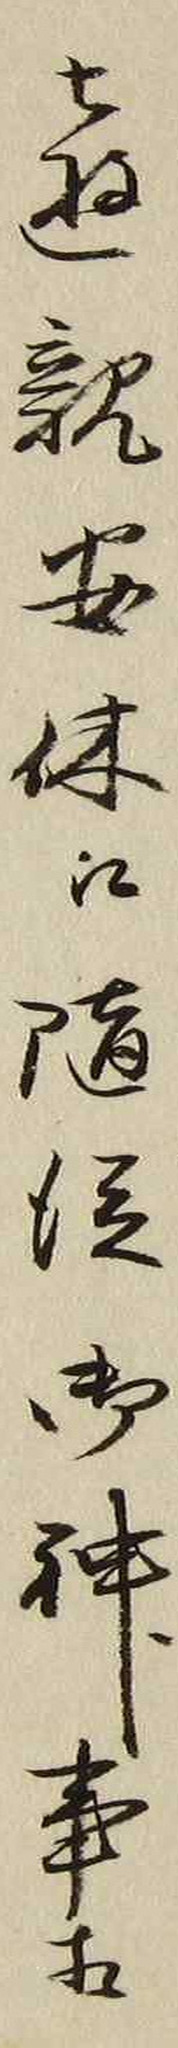被遊親安休江随従御神事相
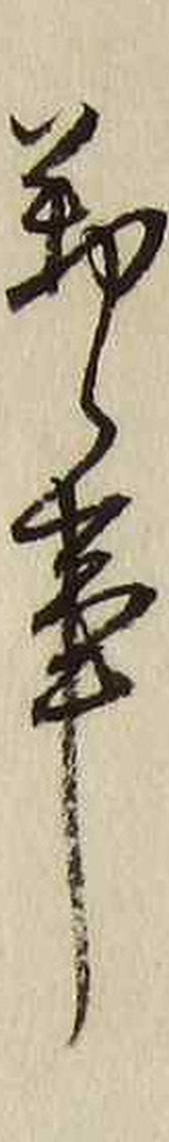勤候事
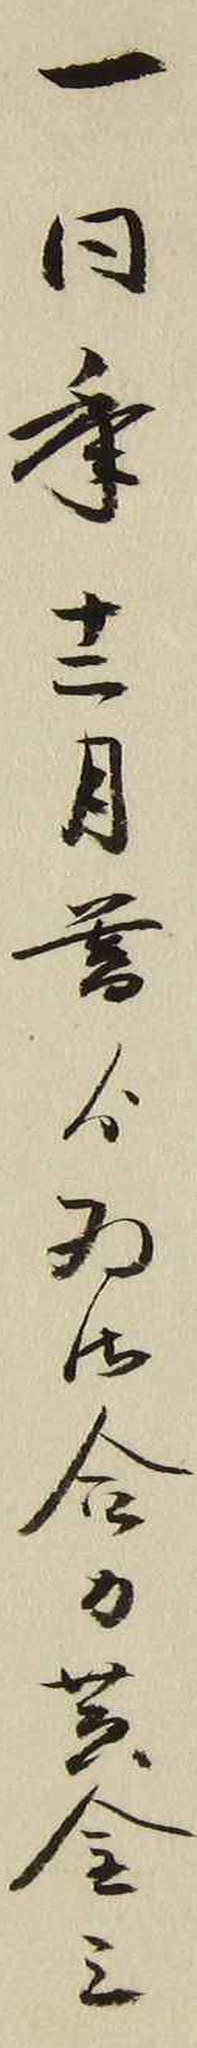一同年十二月暮ゟ為御合力黄金三
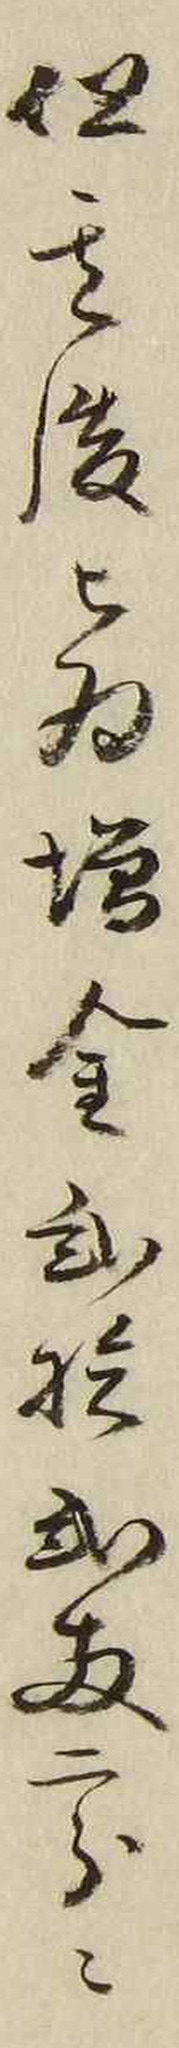但其後被為増金弐拾弐両二分ニ
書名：諸士系譜　巻之291　さ之部23
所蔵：会津若松市立会津図書館
